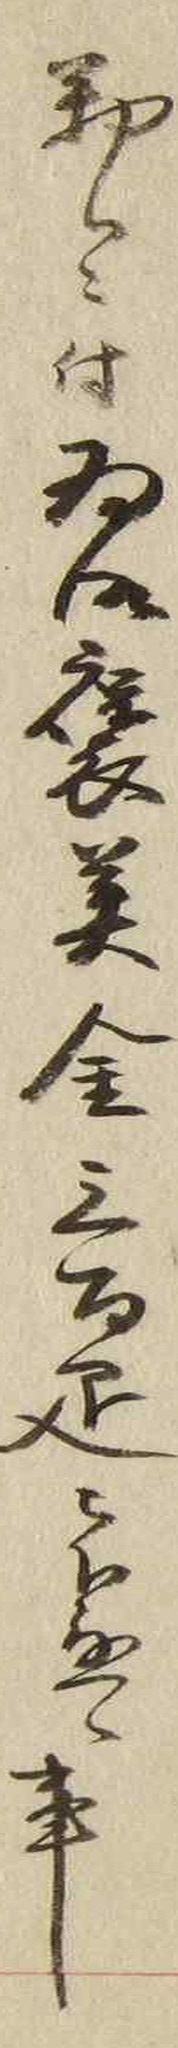勤候ニ付為御褒美金三百疋被下置候事

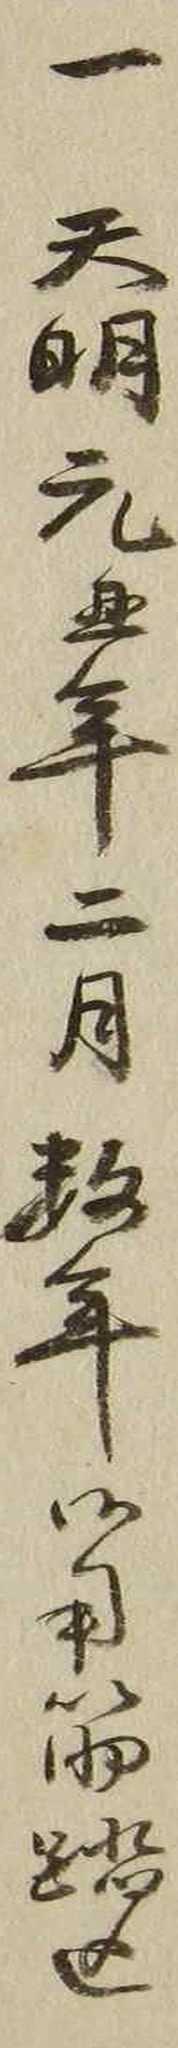一天明元丑年二月数年御用筋踏込
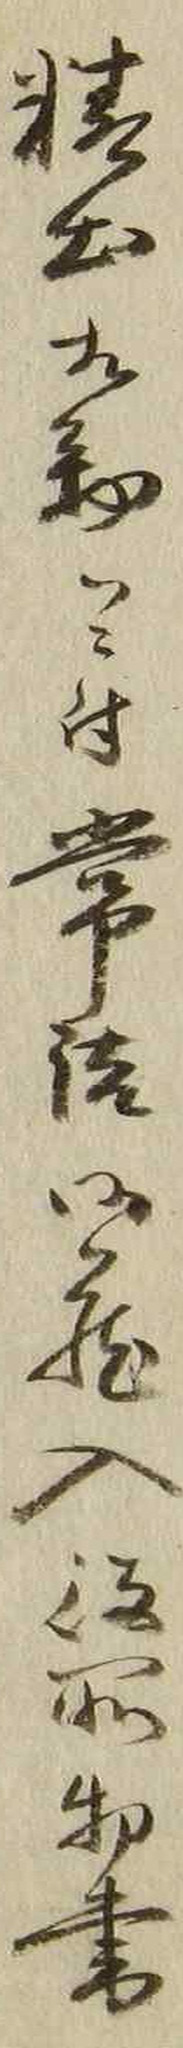精出相勤候ニ付常詰御蔵入役所物書
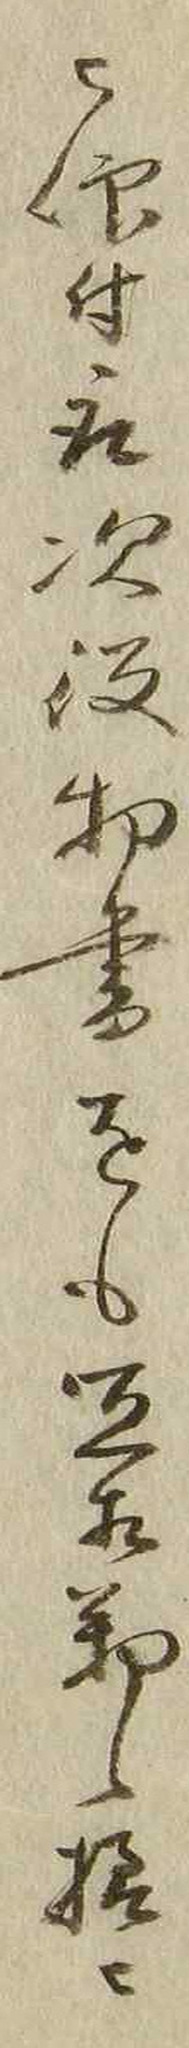被仰付取次役物書をも宜相勤候様被
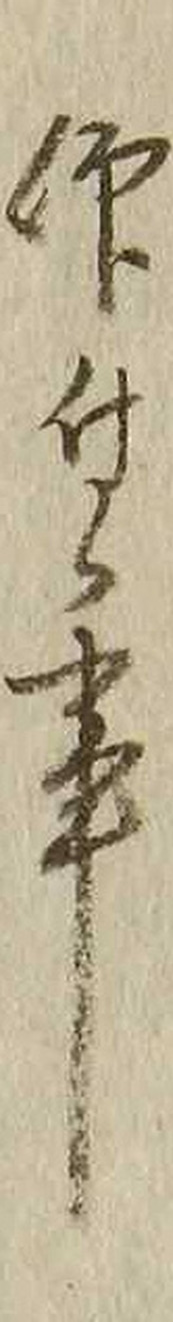仰付候事
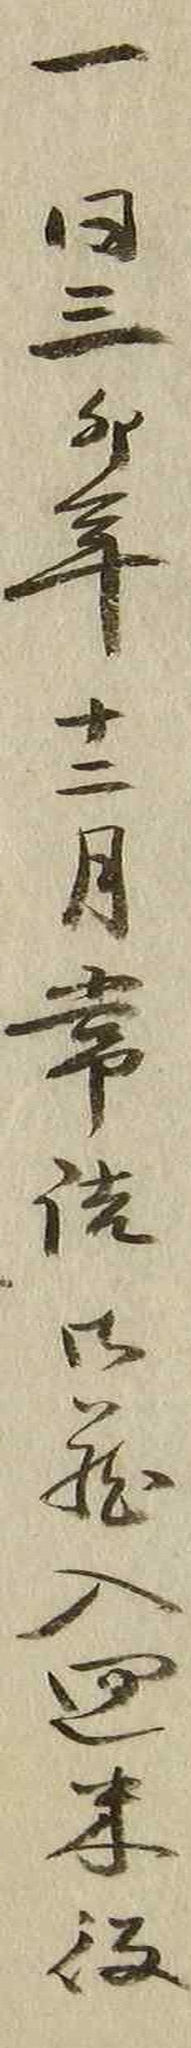一同三卯年十二月常詰御蔵入廻米役
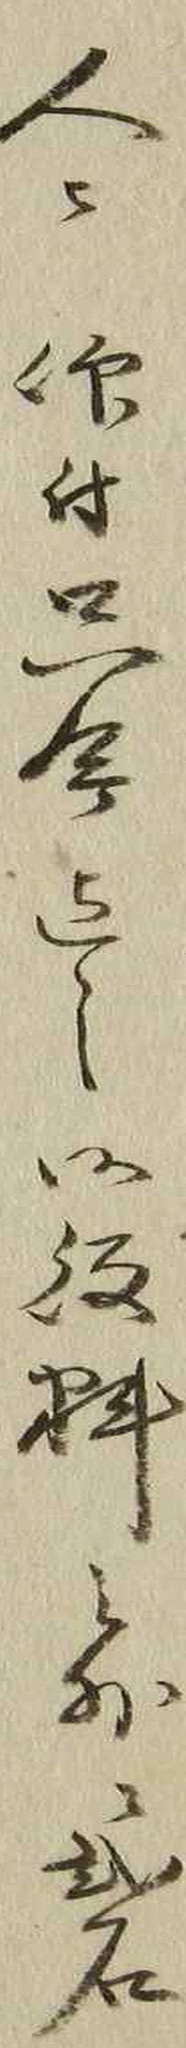人被仰付只今迄之御役料之外ニ弐石
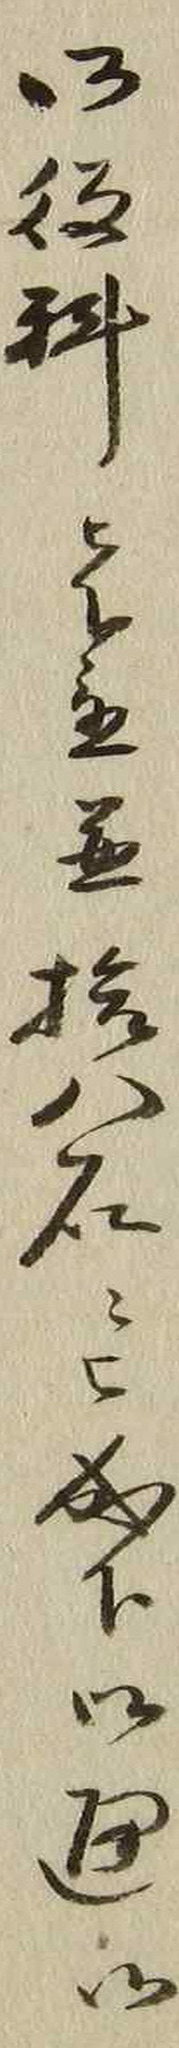御役料被下置並拾八石ニ被成下御通御
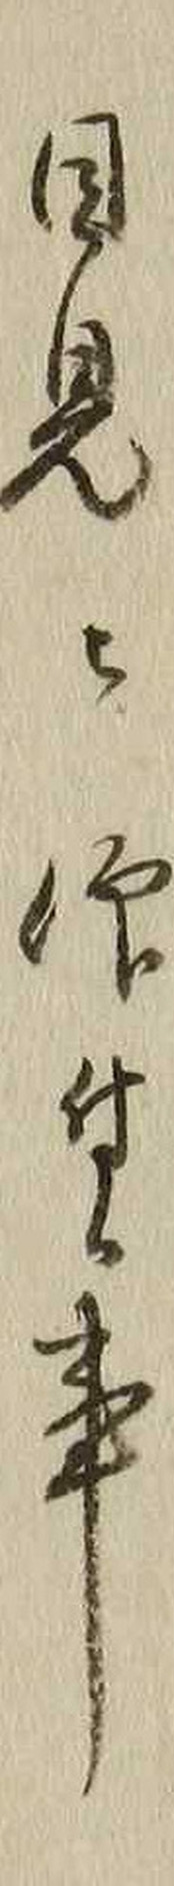目見被仰付候事
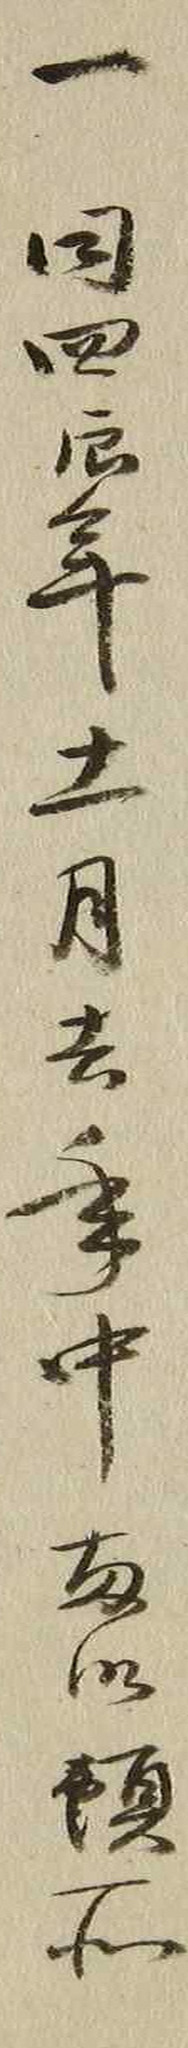一同四辰年十一月去年中両御預所
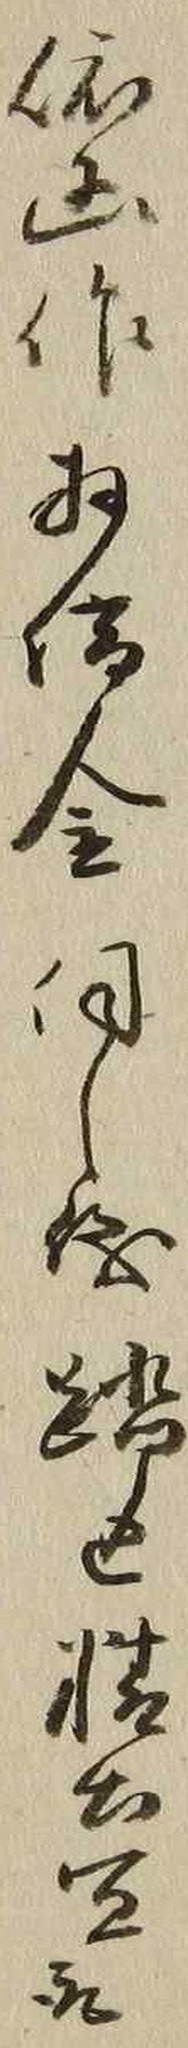依凶作相借金伺之儀踏込精出宜取
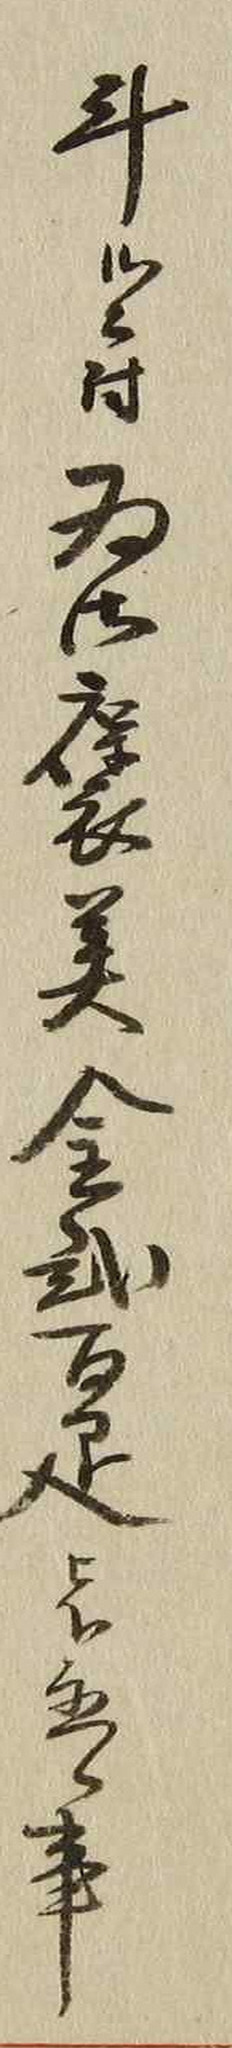計候ニ付為御褒美金弐百疋被下置候事
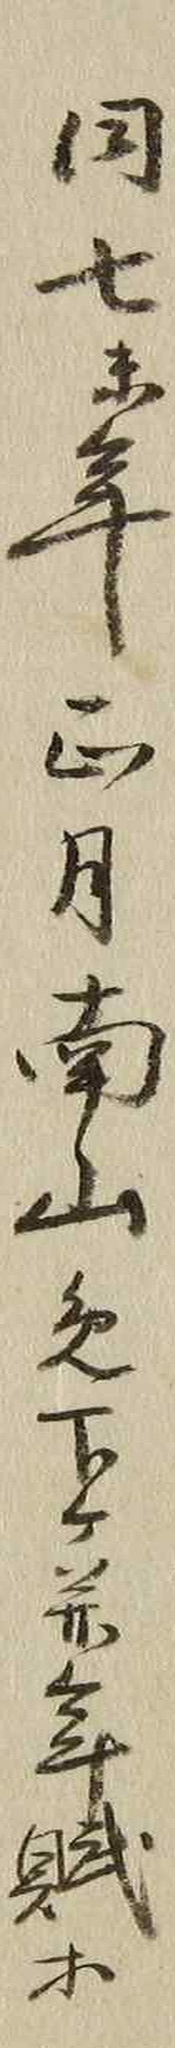一同七未年正月南山免下ヶ并年賦等
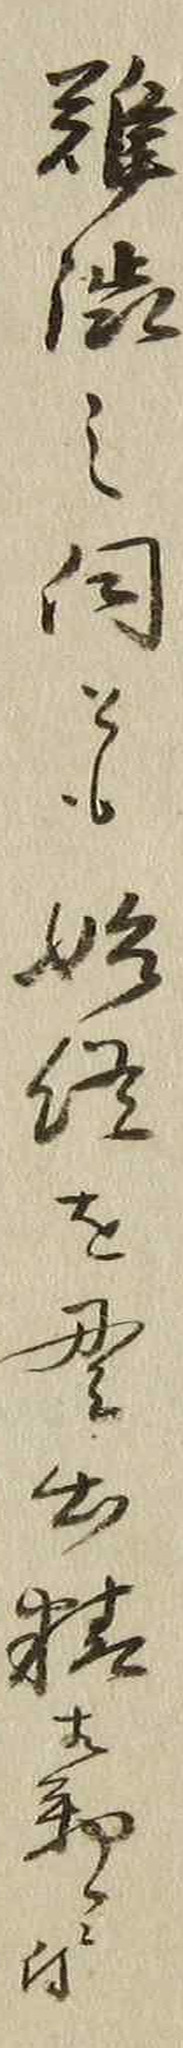難渋之伺とも始終を貫出精相勤候ニ付
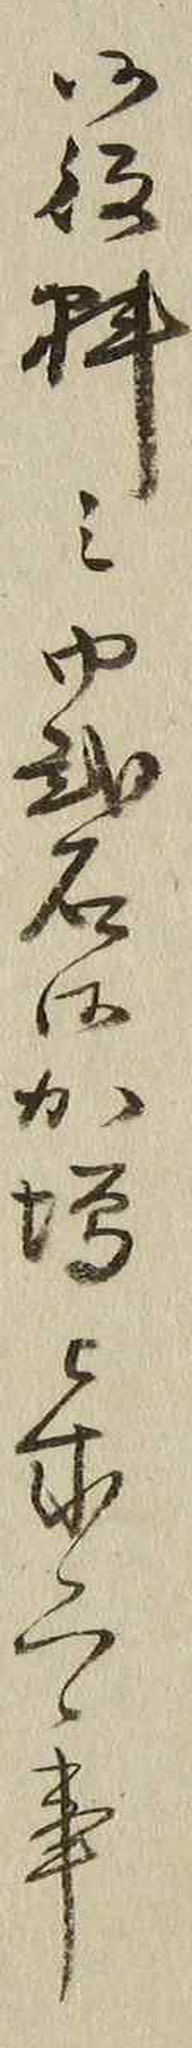御役料之内弐石御加増被成下候事
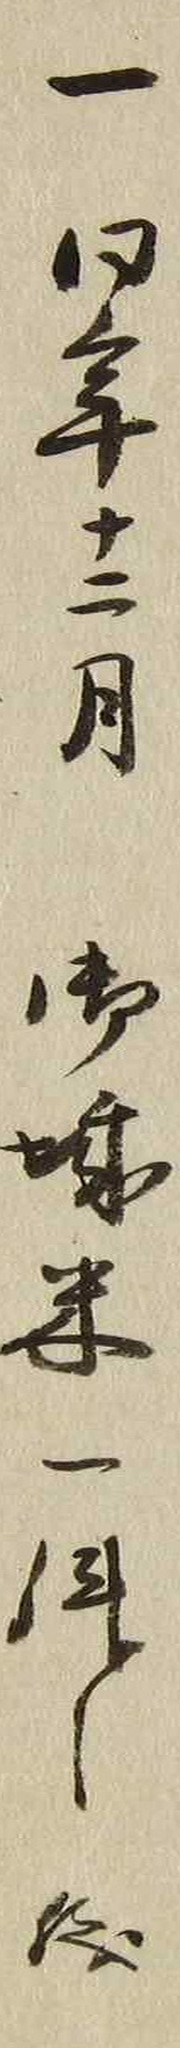一同年十二月御城米一件之儀
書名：諸士系譜　巻之236　ふ之部4
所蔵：会津若松市立会津図書館
